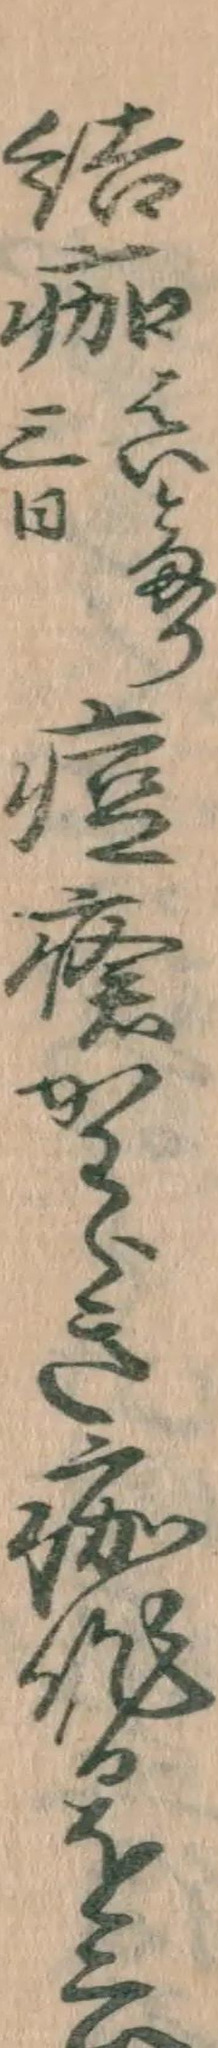結痂はいとまり三日痘瘡かわらき痂作るを云
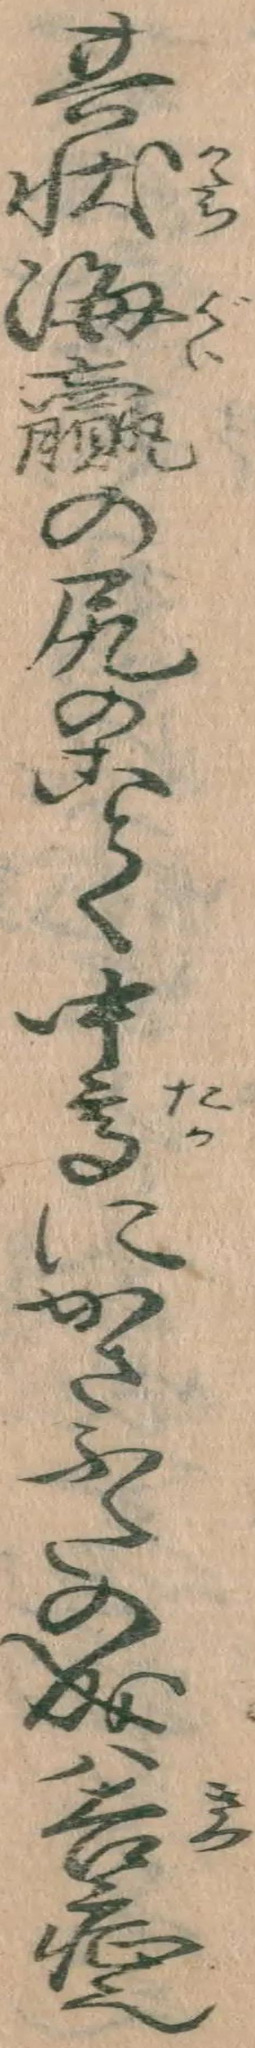其状海贏の尻のことく中高にかさふたの成は吉症也
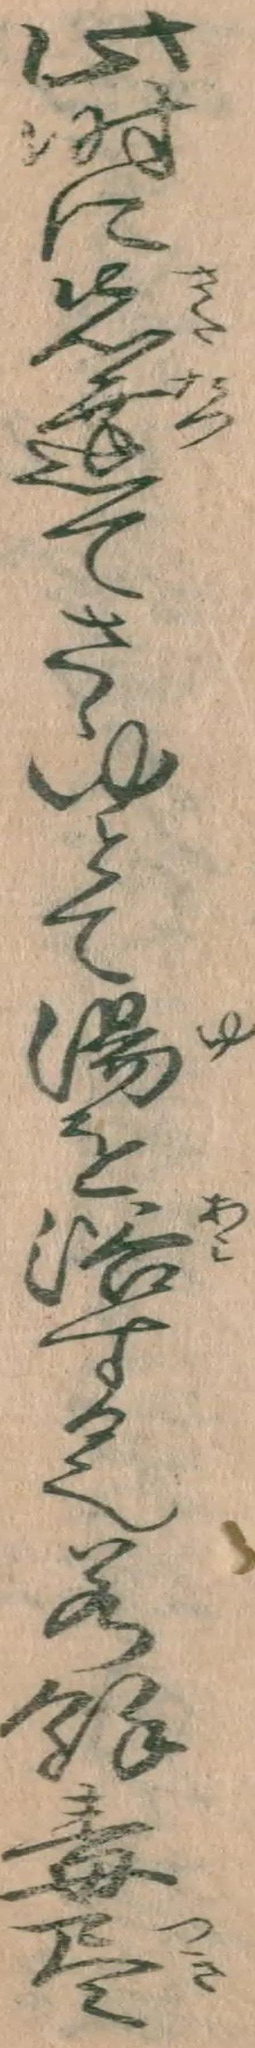此時に先達てさゝゆとて湯を浴する也若余毒尽
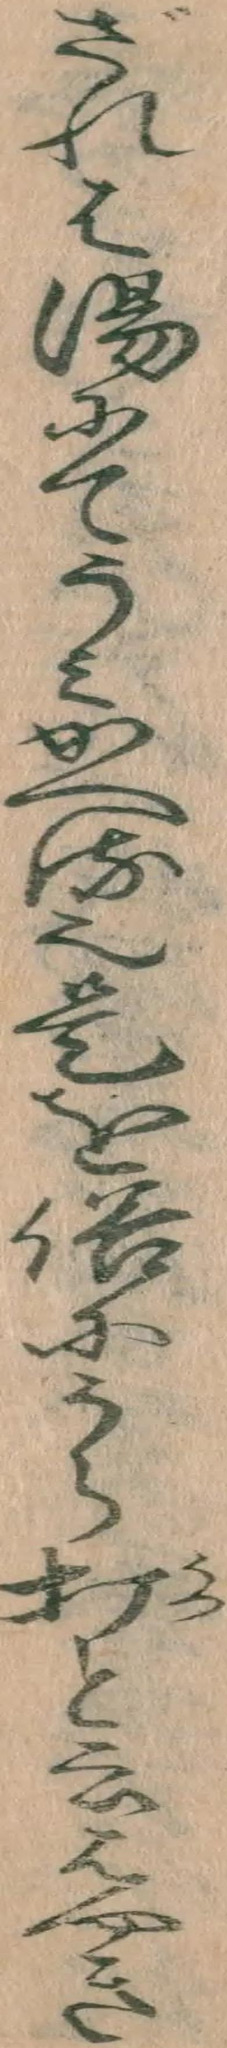ざれは湯にてうみかへる也是を俗にうら打と云はやき
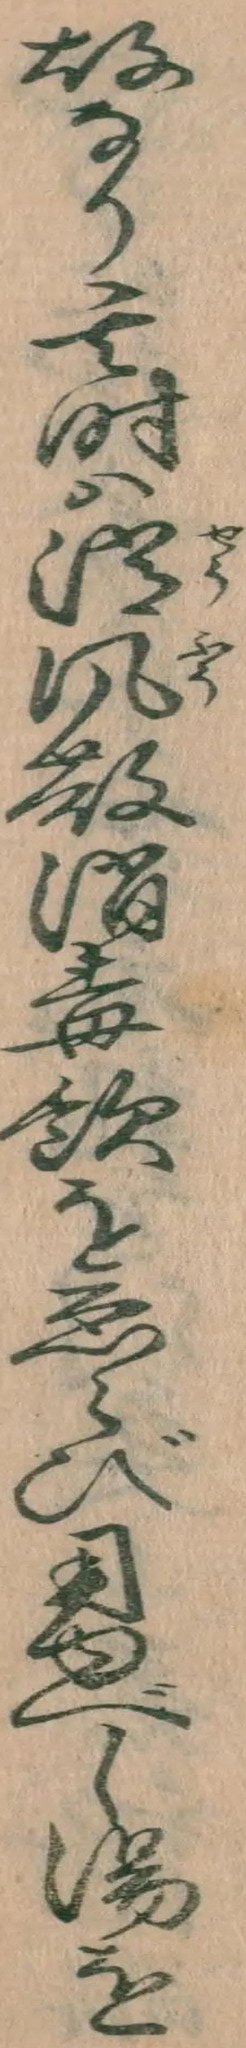故なり其時は消風散消毒飲をゑらび用ゆべし湯を
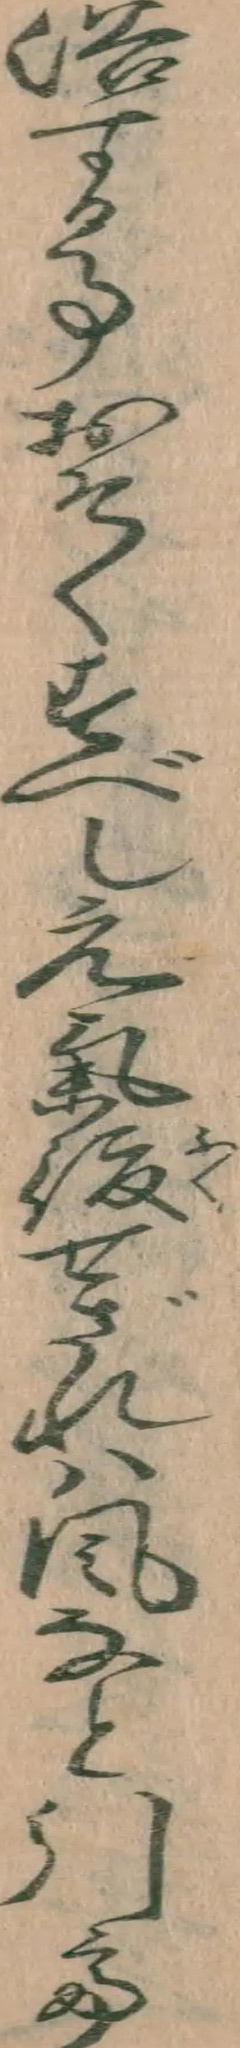浴する事おそくすべし元気復せざれは風なと引て
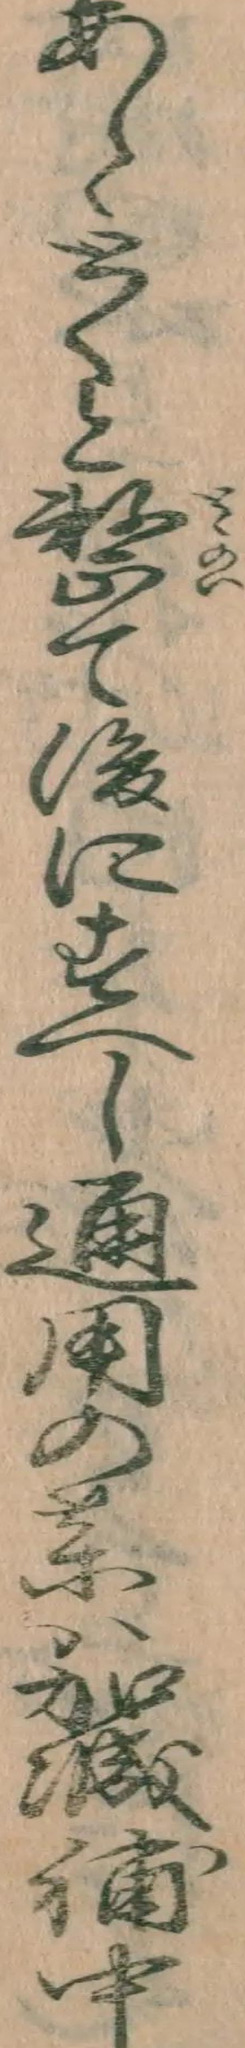あしくとくと整て後にすへし通用の薬は加減補中
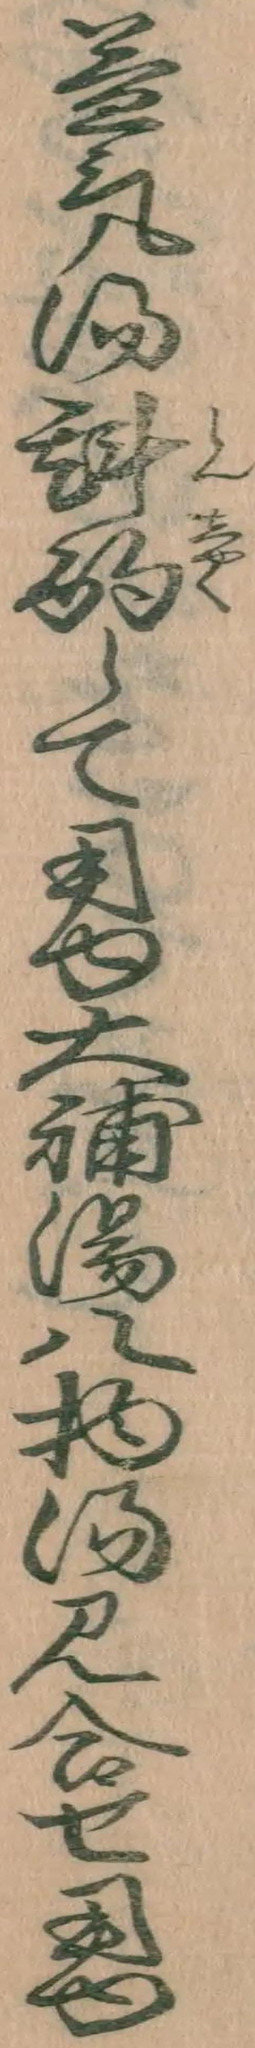益気湯斟酌して用ゆ大補湯八物湯見合せ用ゆ
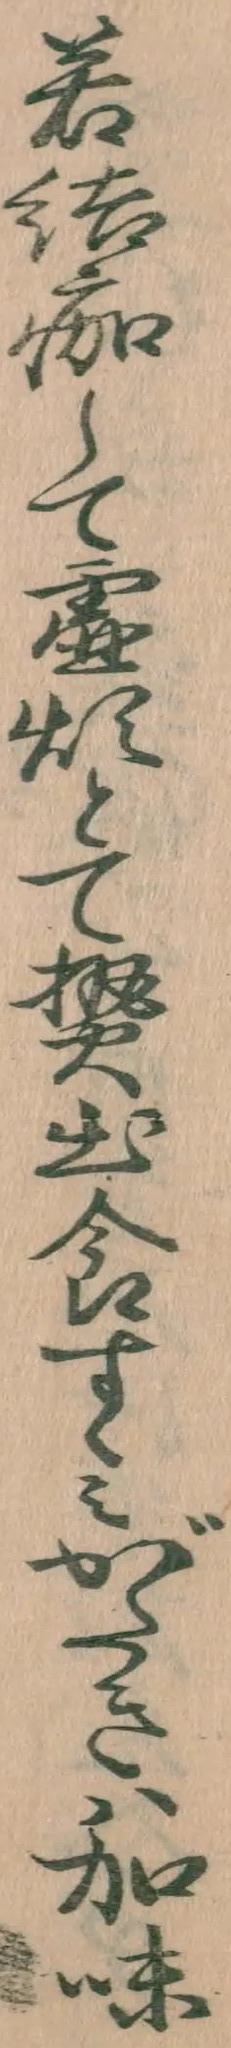若結痂して虚煩とて熱出食すゝみがたきは加味
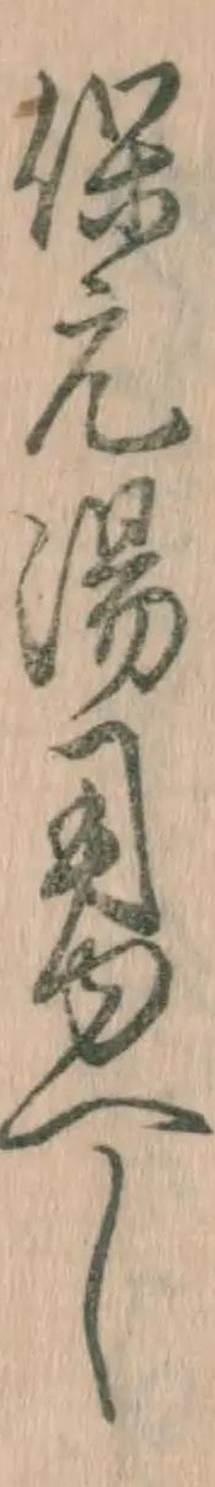保元湯用ゆへし
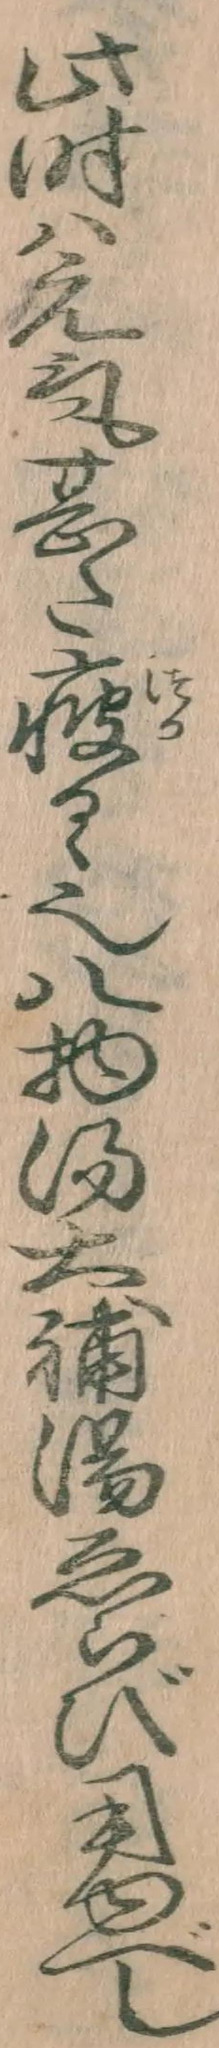此時は元気甚た疲るゝ也八物湯大補湯ゑらび用ゆべし
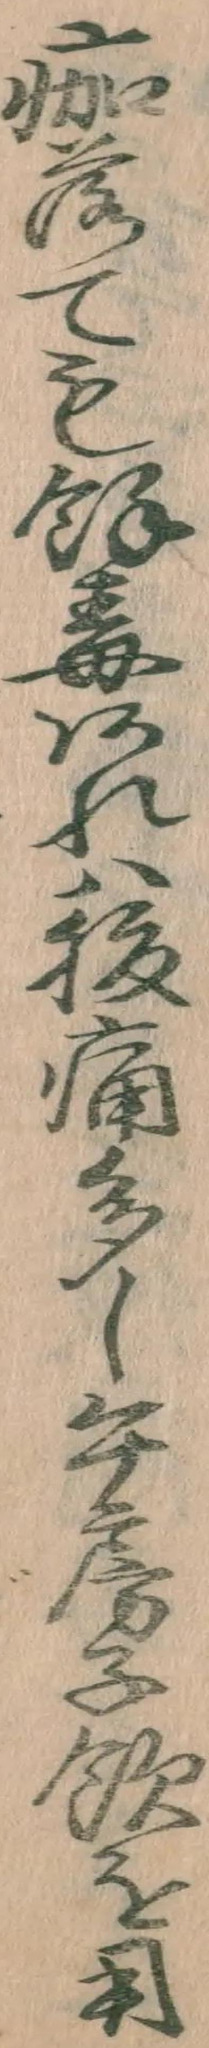痂落ても余毒あれは腹痛多し午房子飲を用
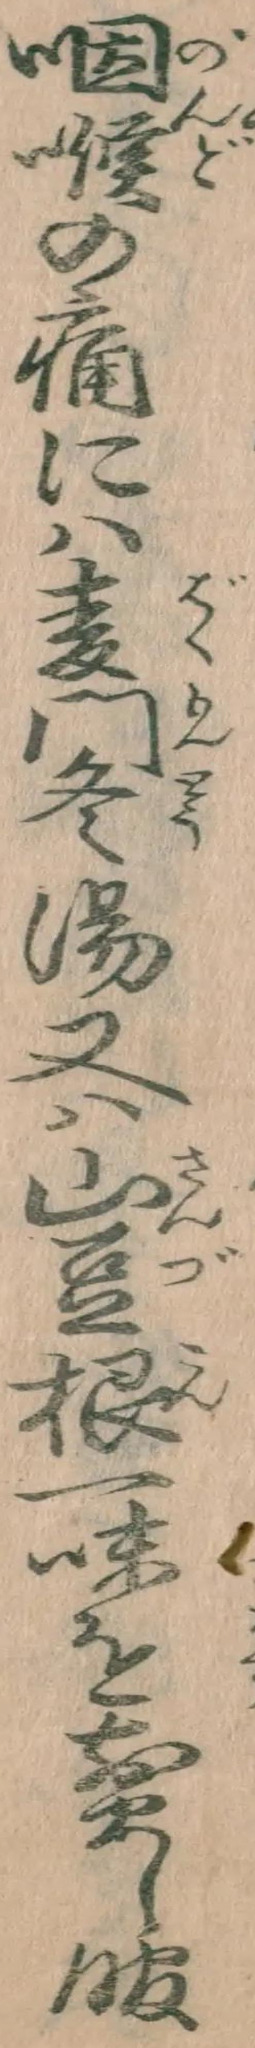咽喉の痛には麦門冬湯又は山豆根一味を煎し服
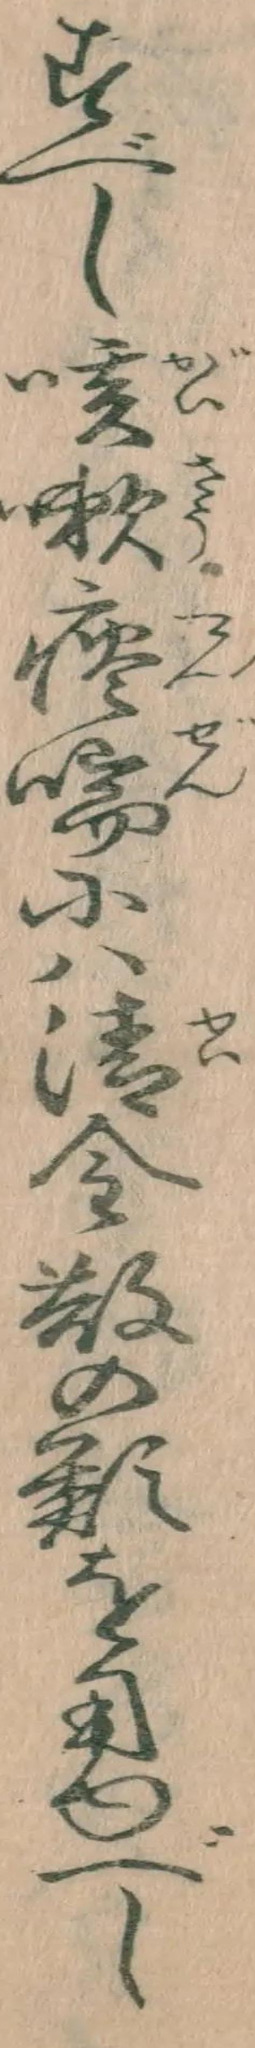すべし咳嗽痰喘には清金散の類を用ゆべし
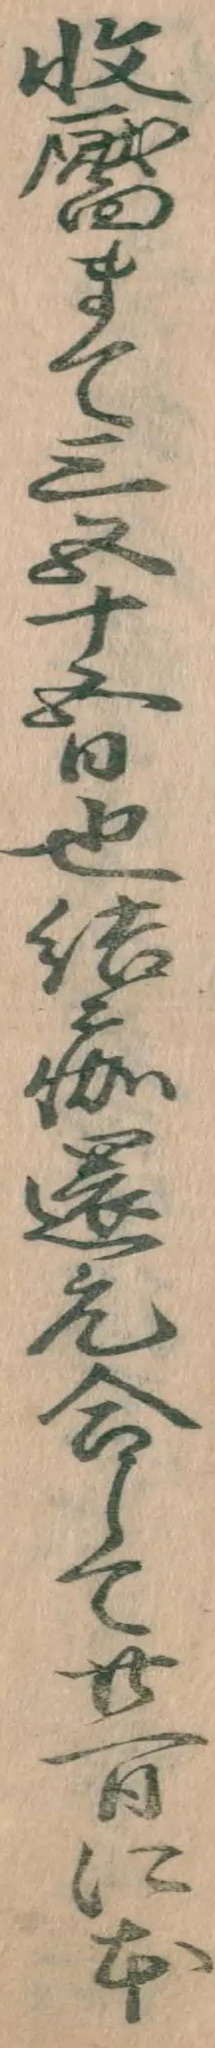収靨まて三五十五日也結痂還元合して廿一日に本

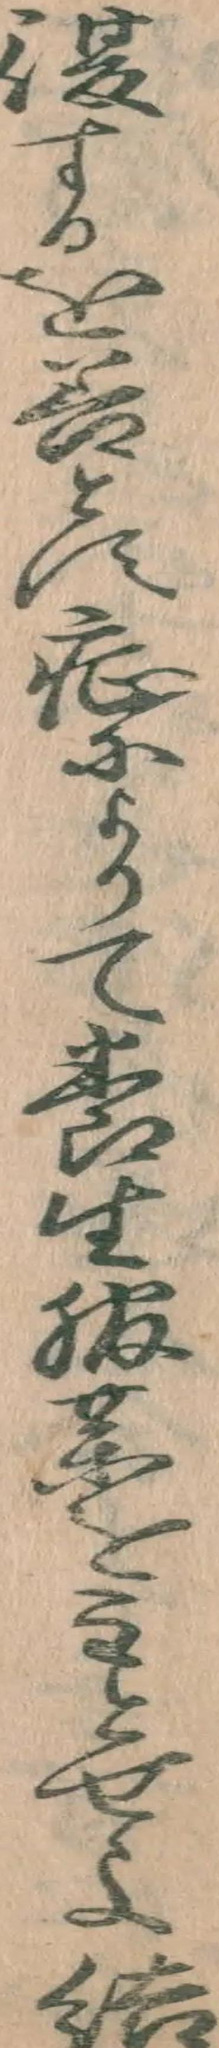復するを善とす症によりて養生服薬を主とせよ結
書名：痘家初心問答
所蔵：国立国会図書館 National Diet Library, JAPAN
